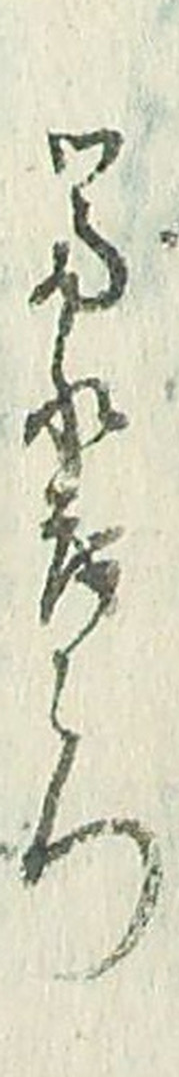富永茂右衛門
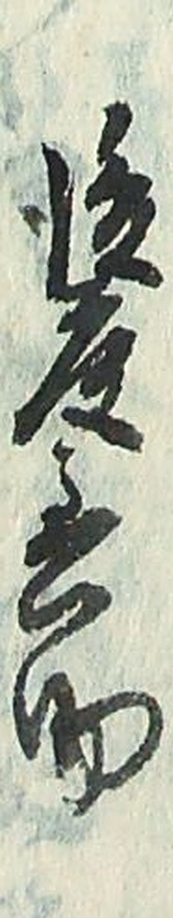後藤善助
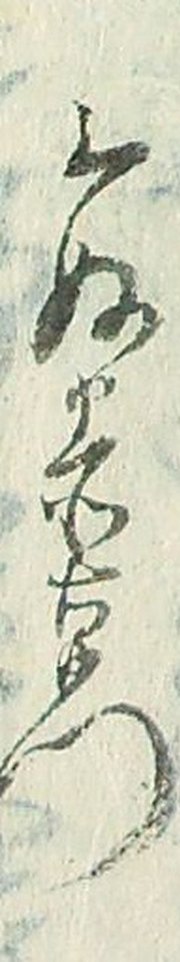三好泰右衛門
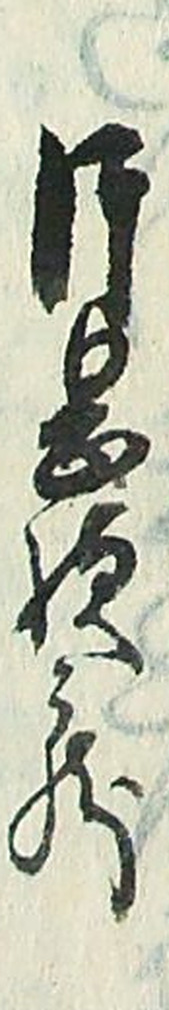片岡積蔵
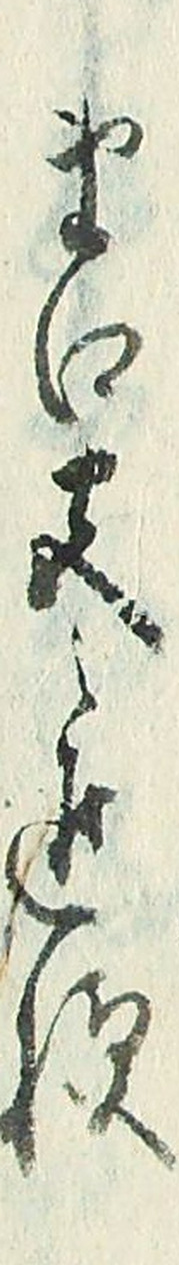野口宮之進様

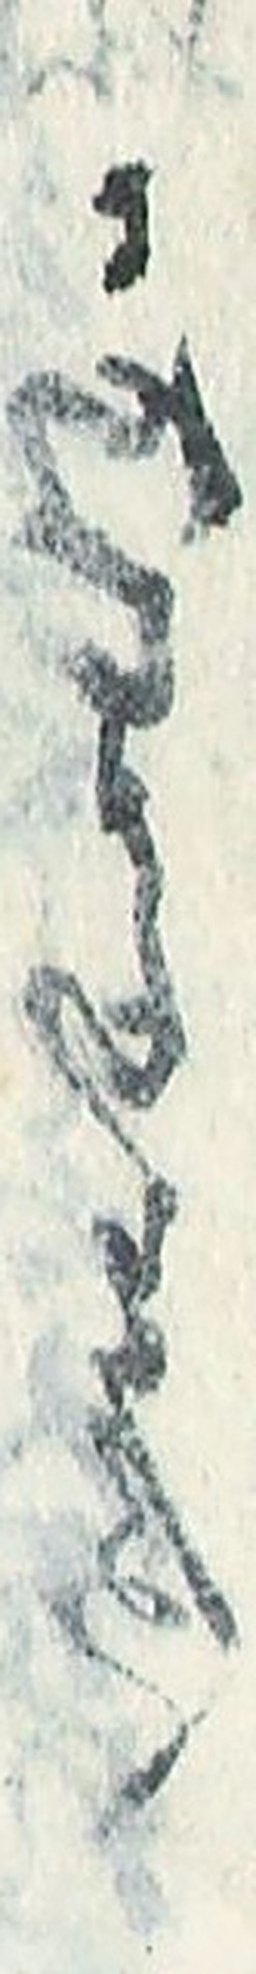十一月十日
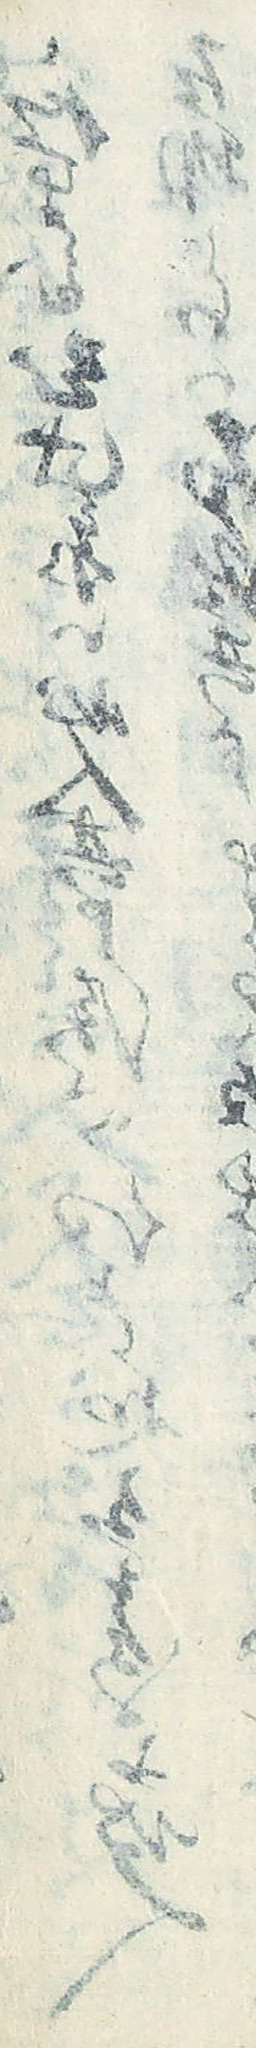十一月十日
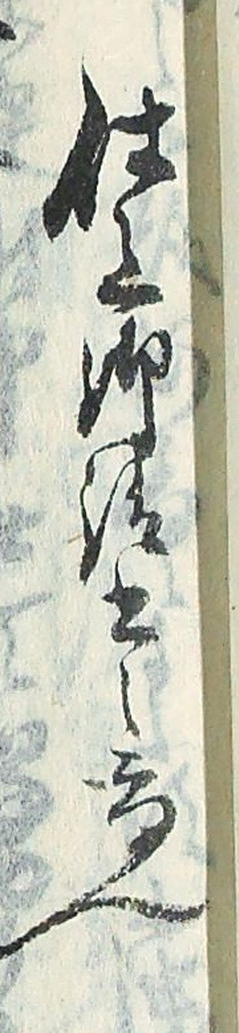仕上御請書之覚
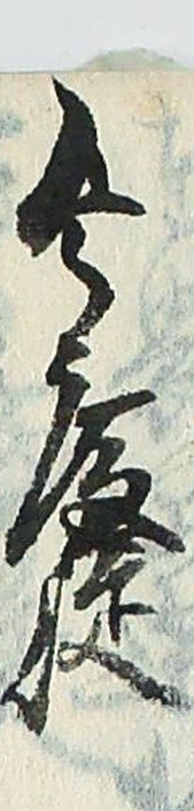今度従
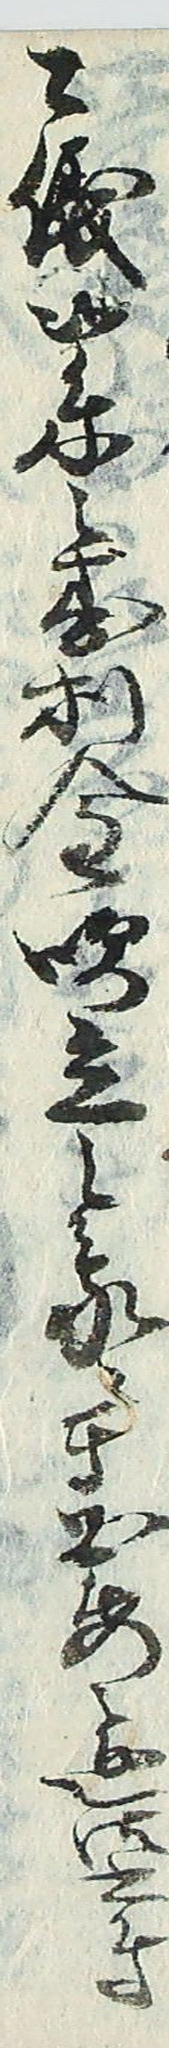公儀弐朱之歩判金吹立之義に付別帋之通御書付
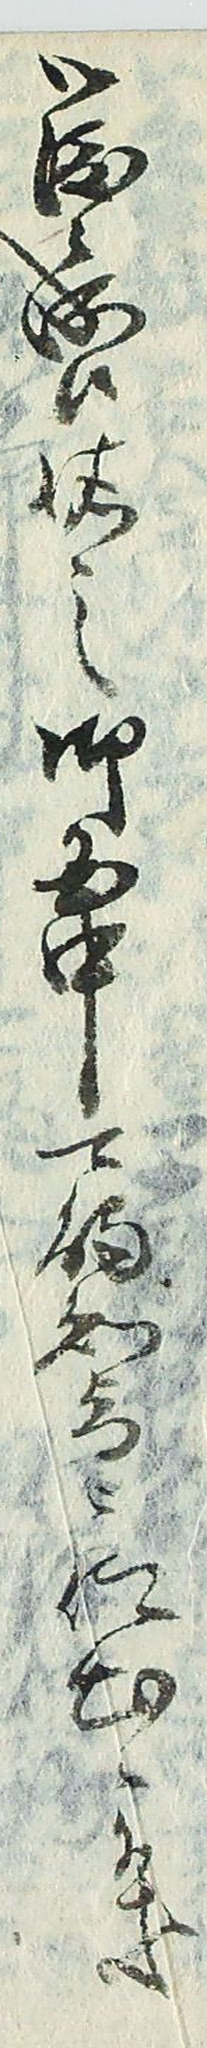御渡被成候依之御国中可触知旨被仰出候条
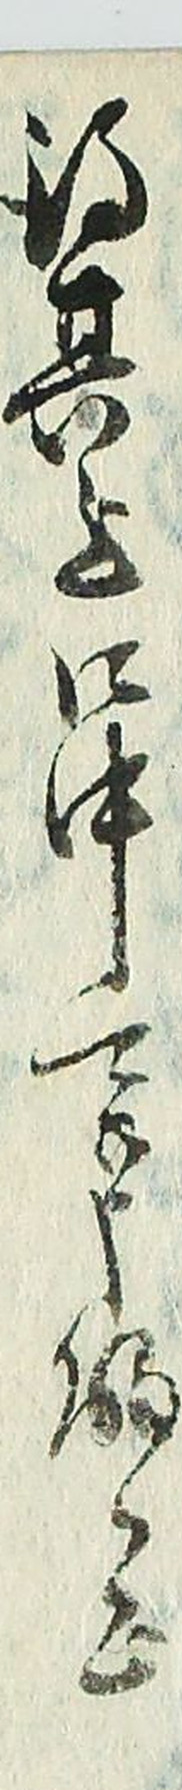得其意郷中可被申触候以上
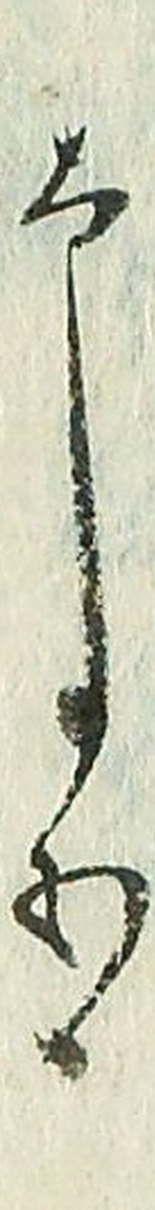十一月十日
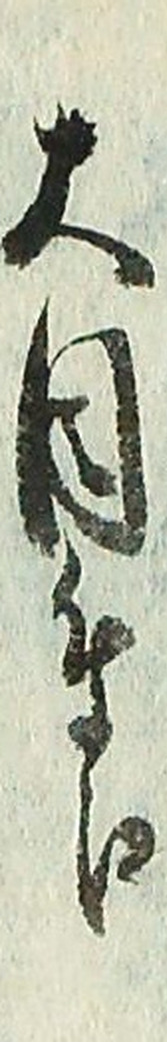大目付江
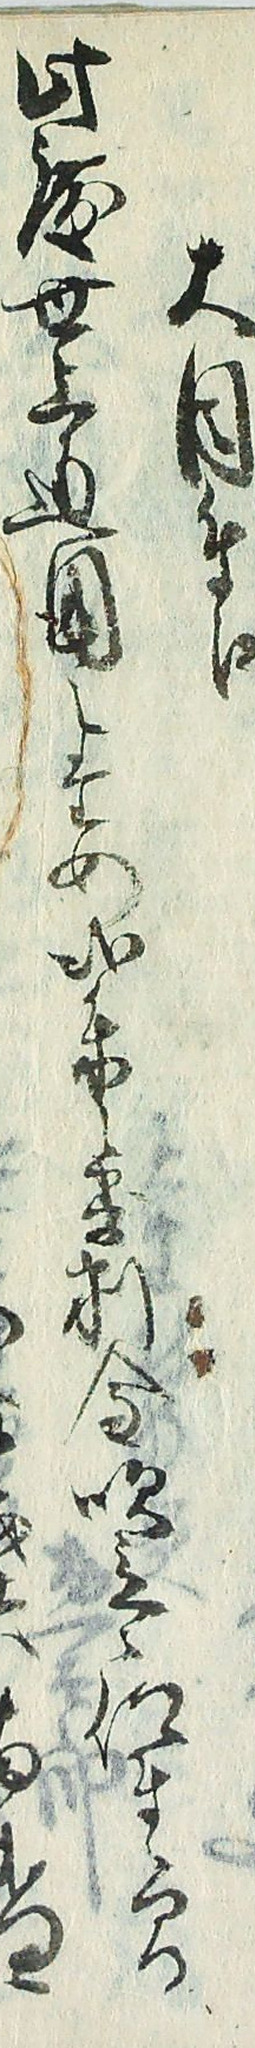此度世上通用之ため弐朱歩判金吹立被仰付候間
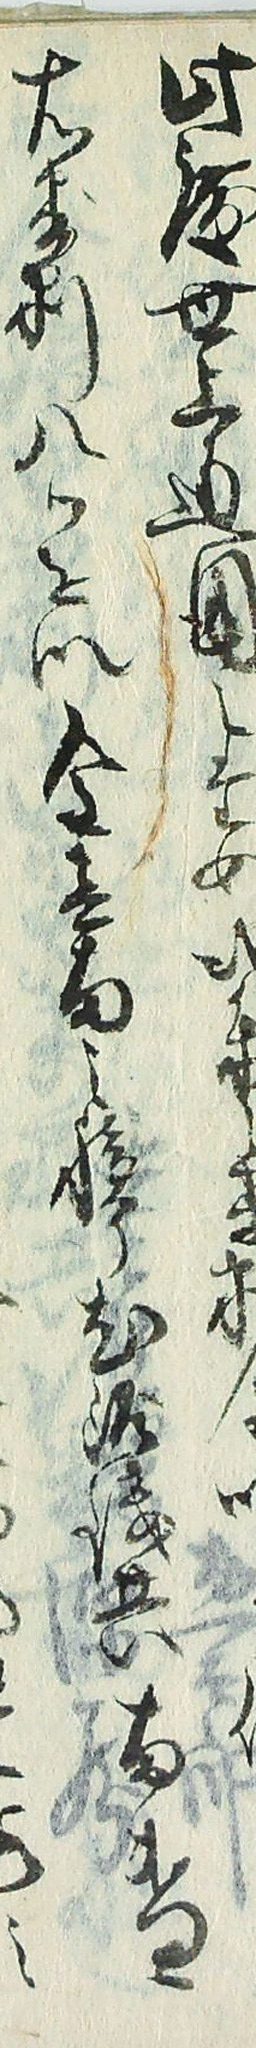右歩判八つを以金壱両之積り尤銀銭共両替
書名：諸御用御□受書控
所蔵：鳴門教育大学 Naruto University of Education
